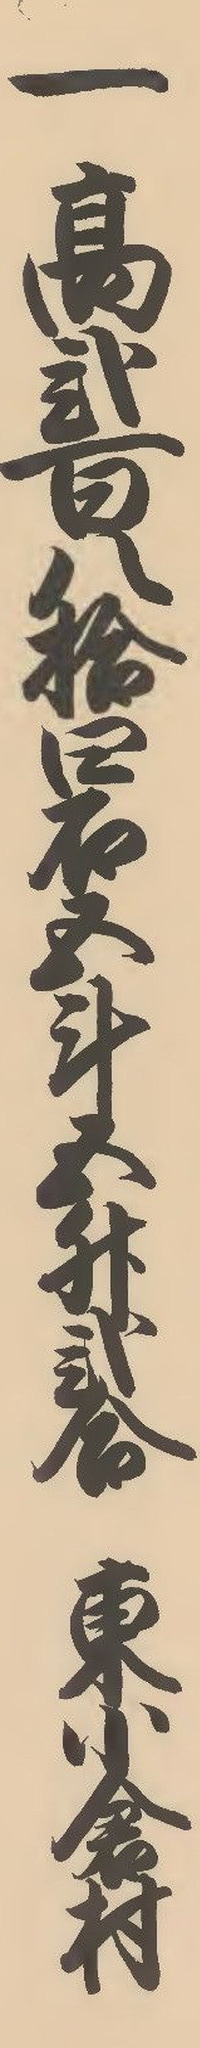一髙弐百八拾四石五斗五升弐合東小倉村
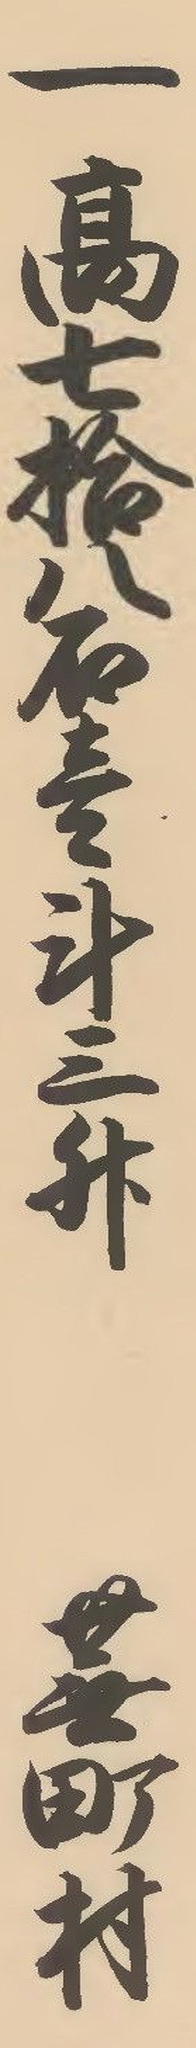一髙七拾八石壱斗三升蕪町村

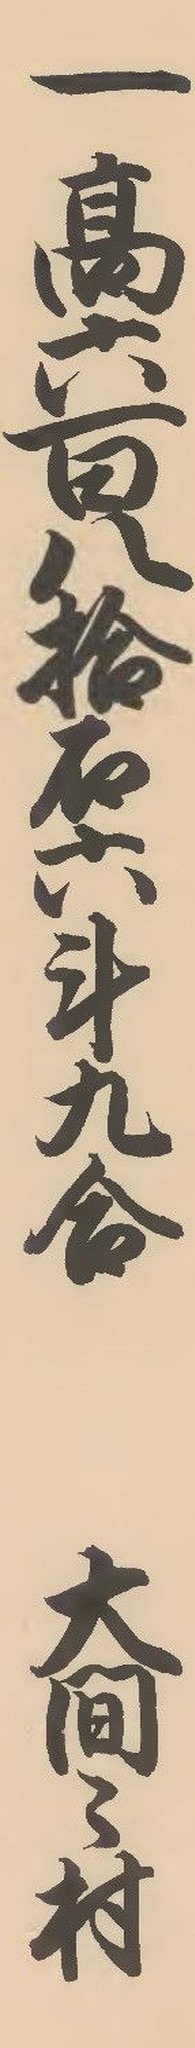一髙六百八拾石六斗九合大間々村
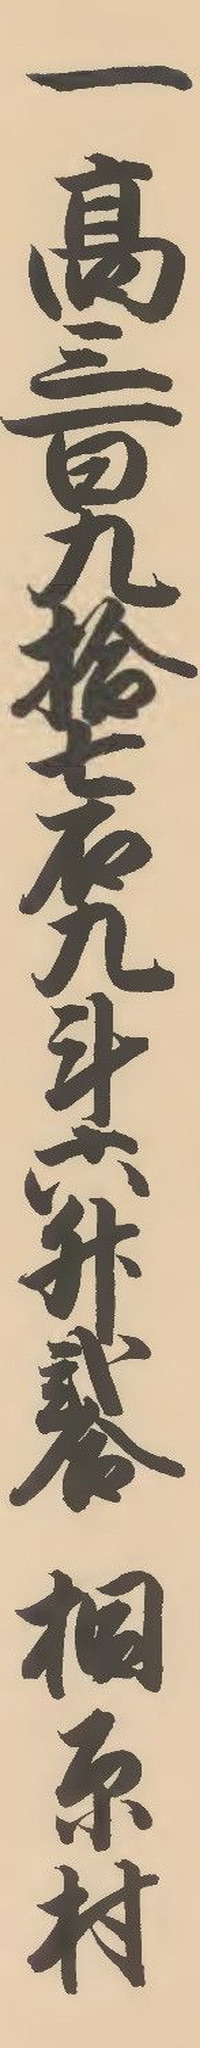一髙三百九拾七石九斗六升弐合原村
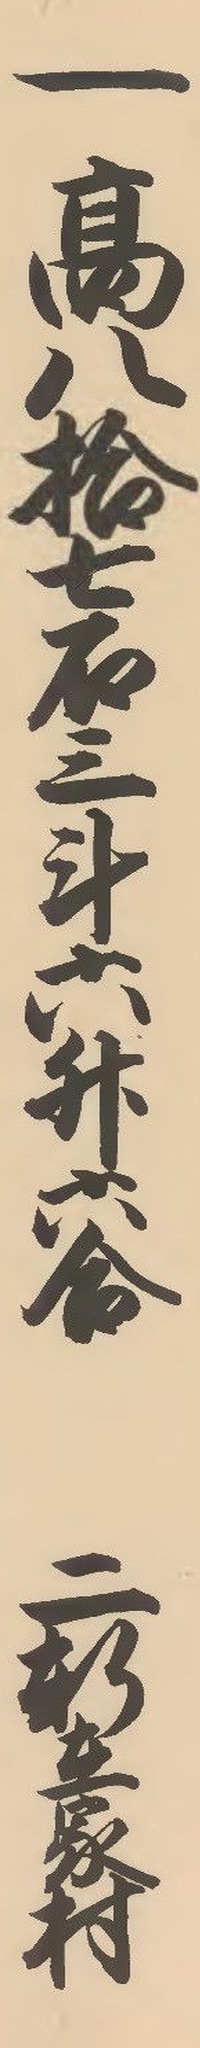一髙八拾七石三斗六升六合二軒在家村
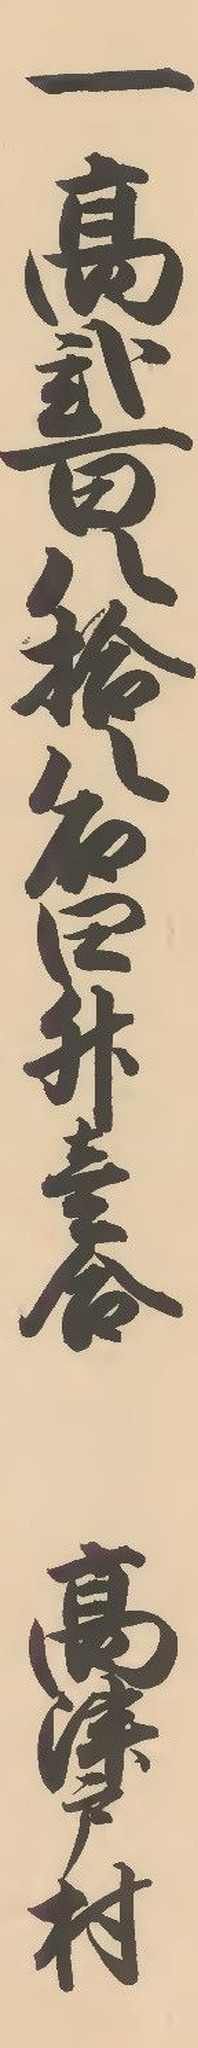一髙弐百八拾八石四升壱合髙津戸村
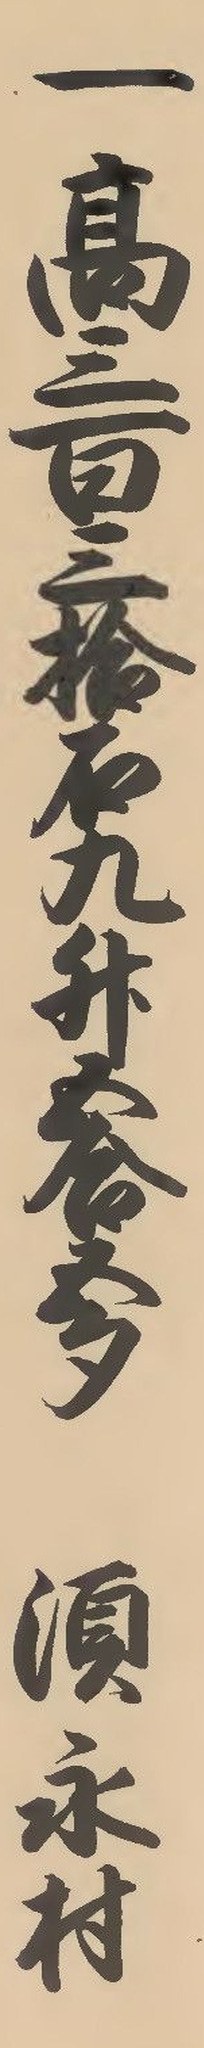一髙三百三拾石九升五合五夕須永村
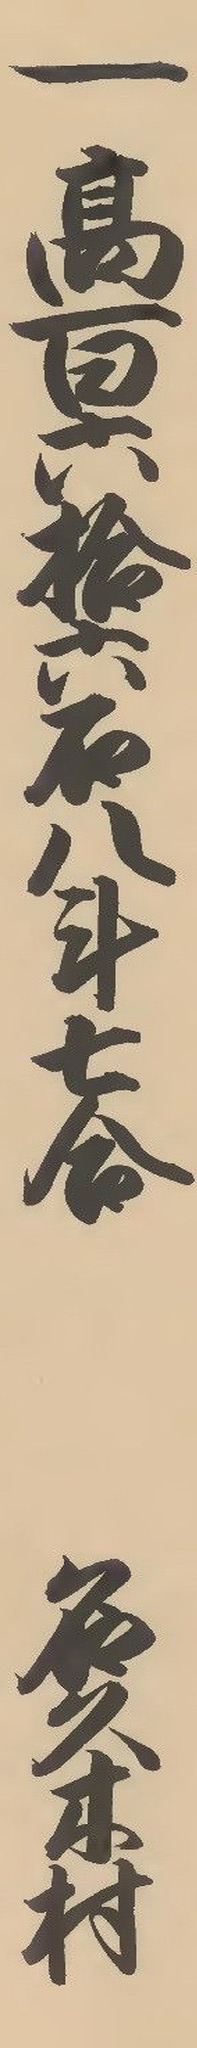一髙六拾六石八斗七合名久木村
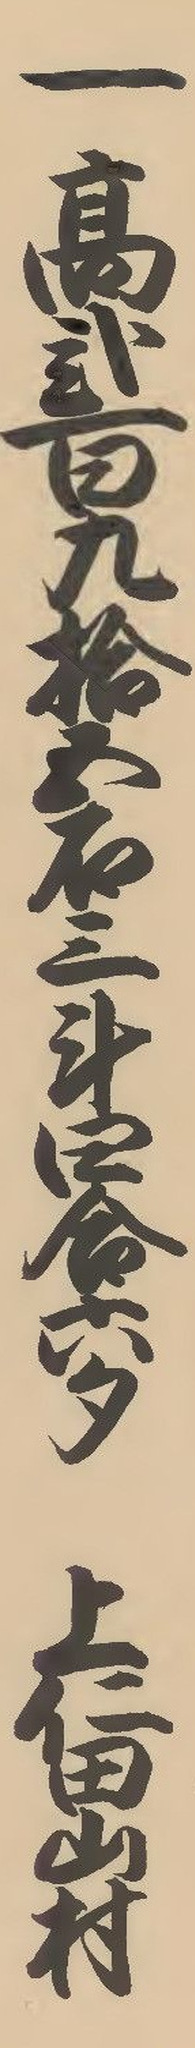一髙弐百九拾五石三斗四合六夕上仁田山村

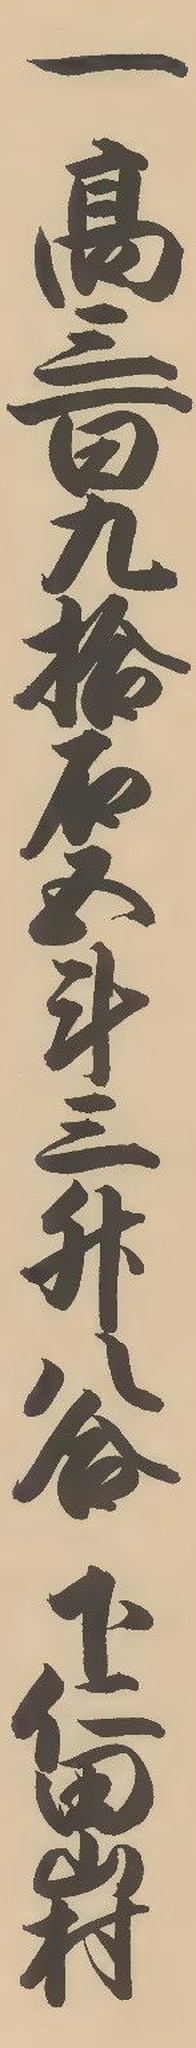一髙三百九拾石五斗三升八合下仁田山村
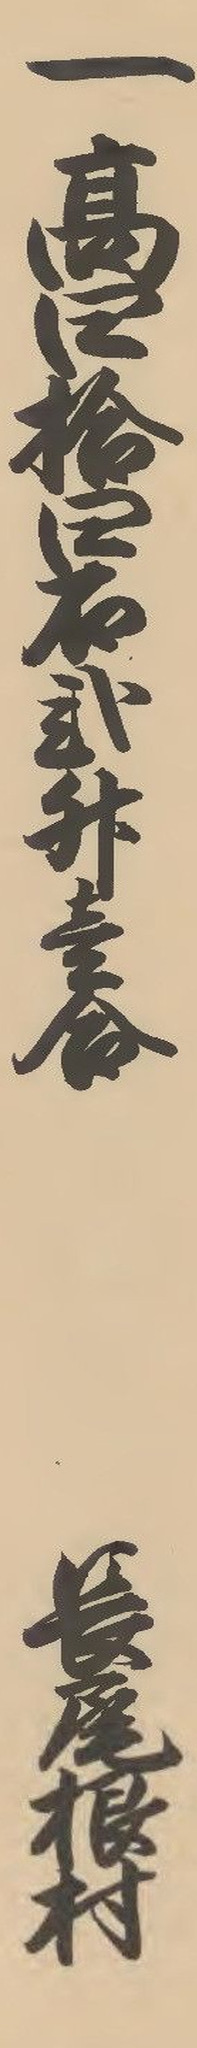一髙四拾四石弐升壱合長尾根村
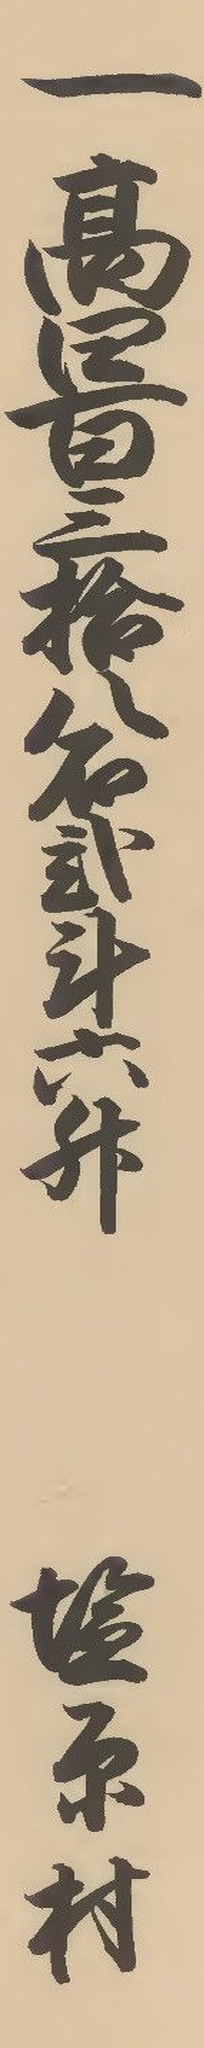一髙四百三拾八石弐斗六升塩原村
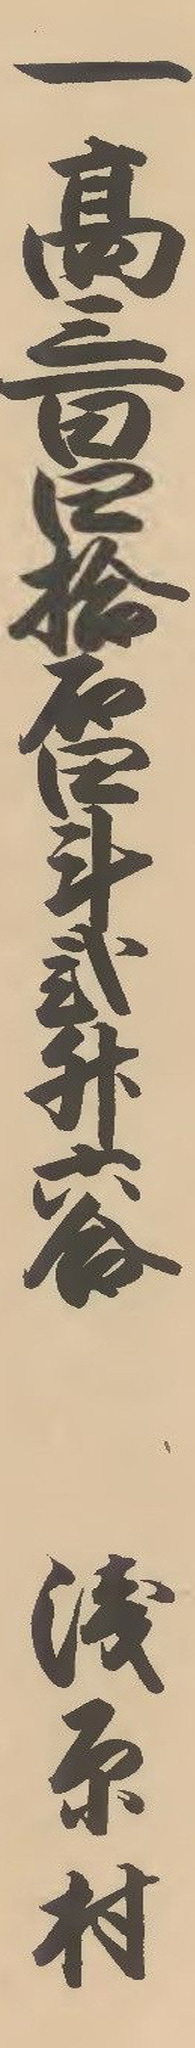一髙三百四拾石四斗弐升六合浅原村
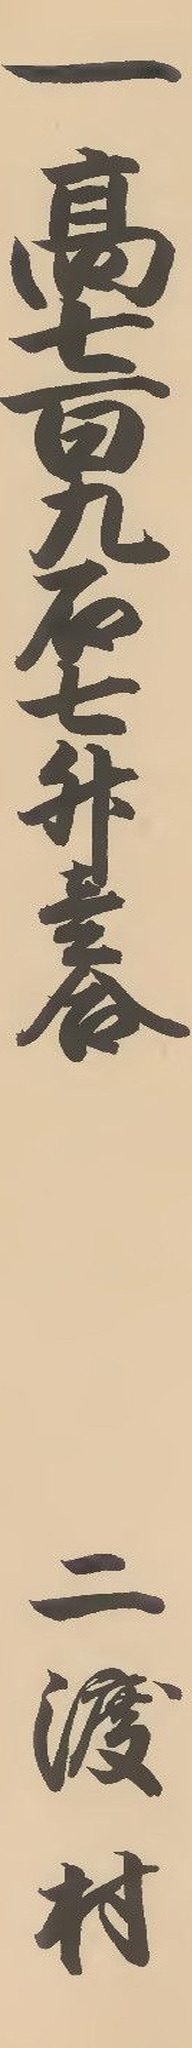一髙七百九石七升壱合二渡村
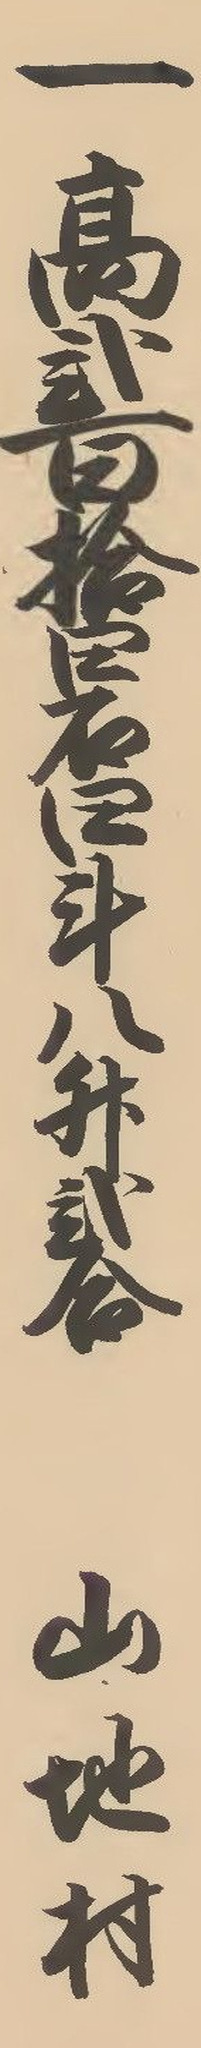一髙弐百拾四石四斗八升弐合山地村
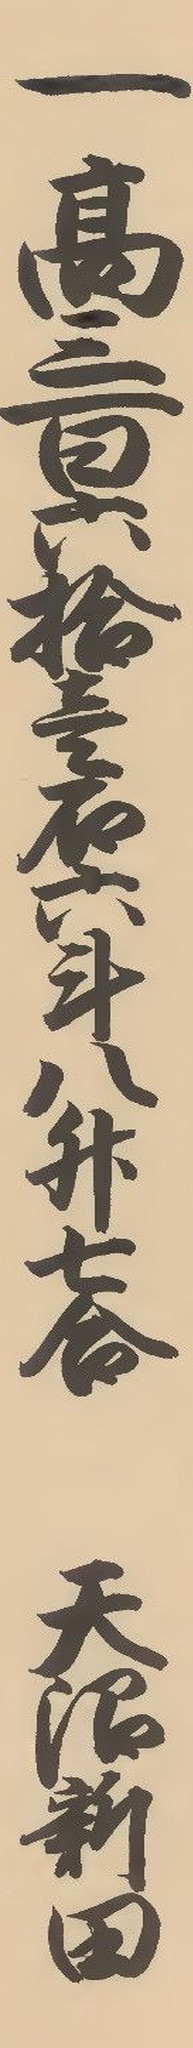一髙三百六拾壱石六斗八升七合天沼新田
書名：上野国郷帳
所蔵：国立公文書館 National Archives of Japan
